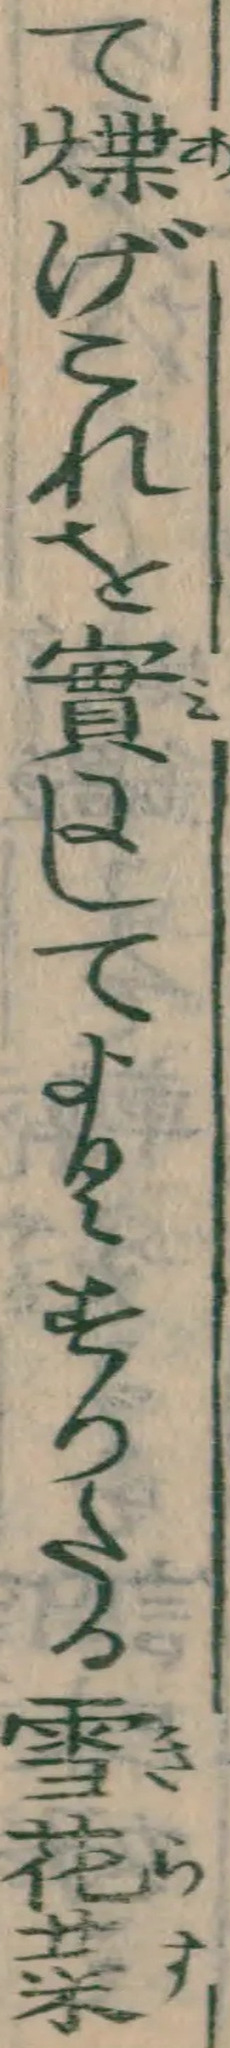て煠げこれを実にしてよくすりたる雪花菜
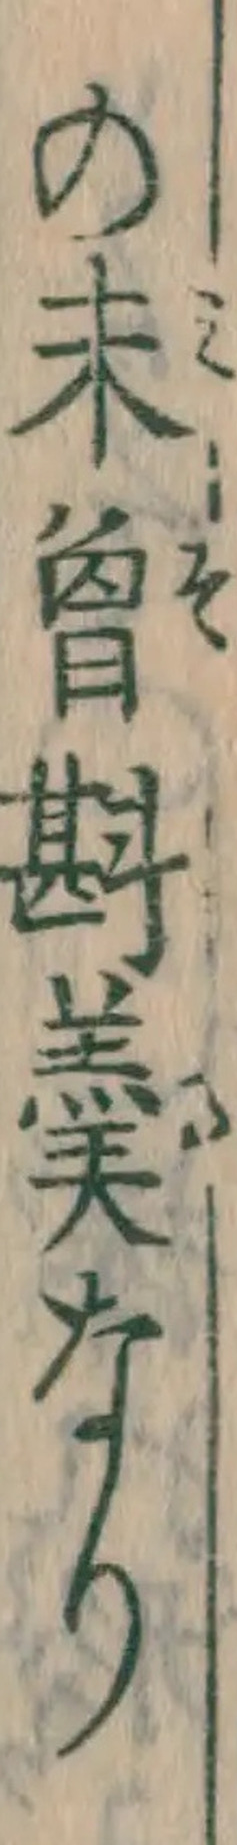の未曽斟羹なり
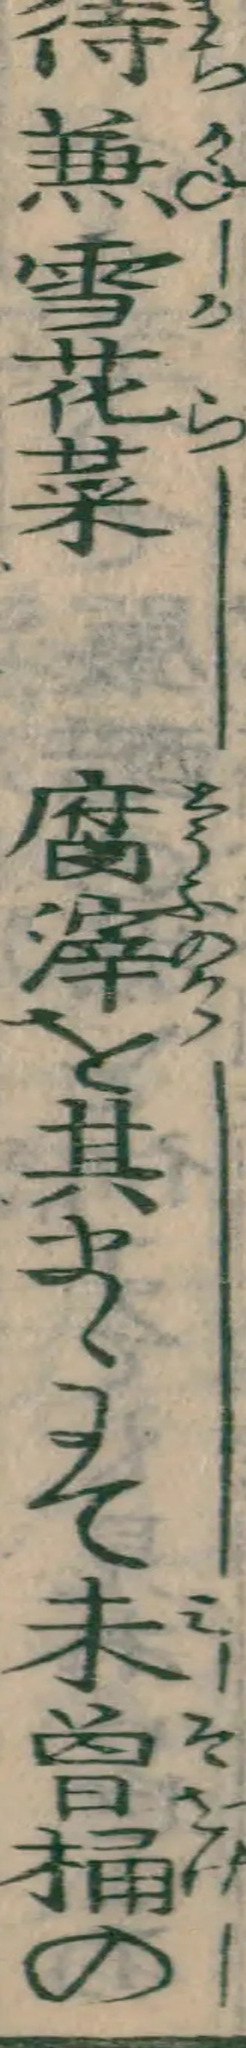卅四待兼雪花菜腐滓を其まゝにて未曽桶の
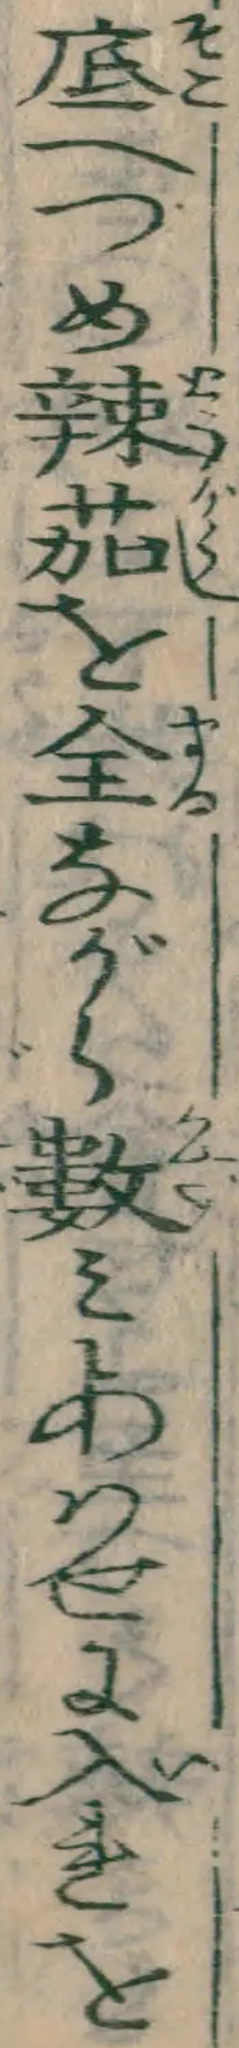底へつめ辣茄を全ながら数みあはせに入れを
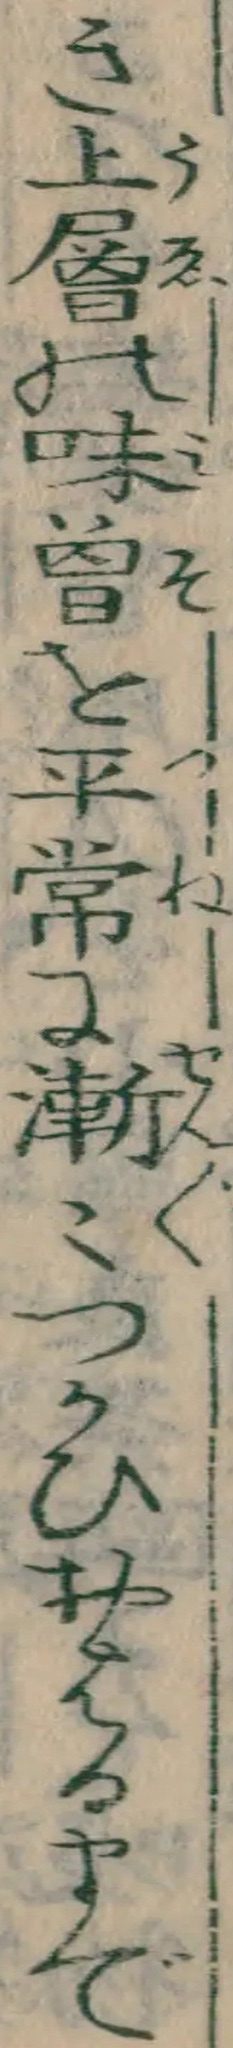き上層の未曽を平常に漸々つかひおはるまで
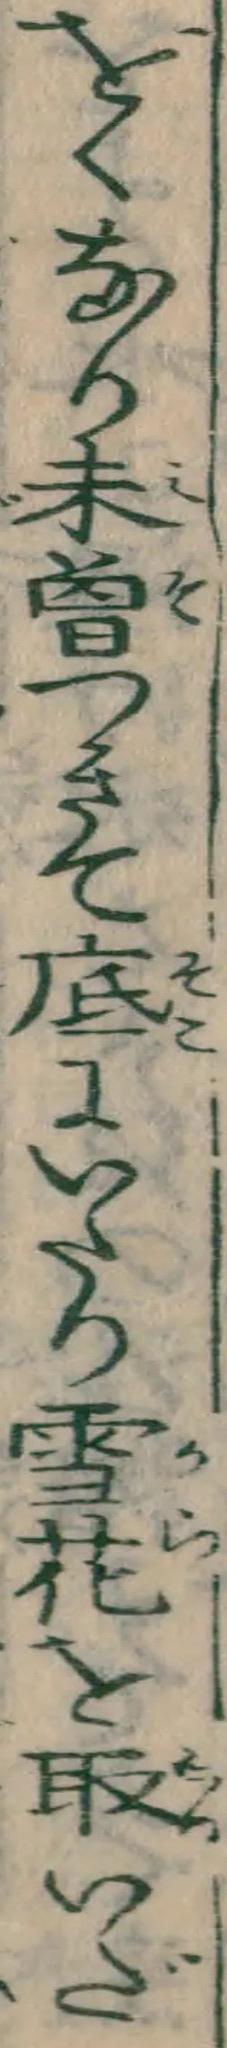をくなり未曽つきて底にいたり雪花を取いだ
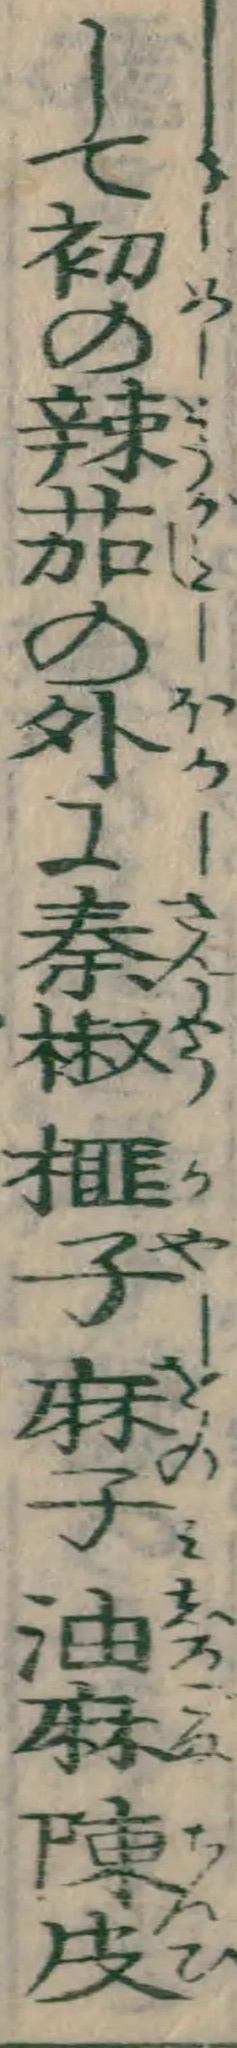して初の辣茄の外に秦椒榧子麻子油麻陳皮
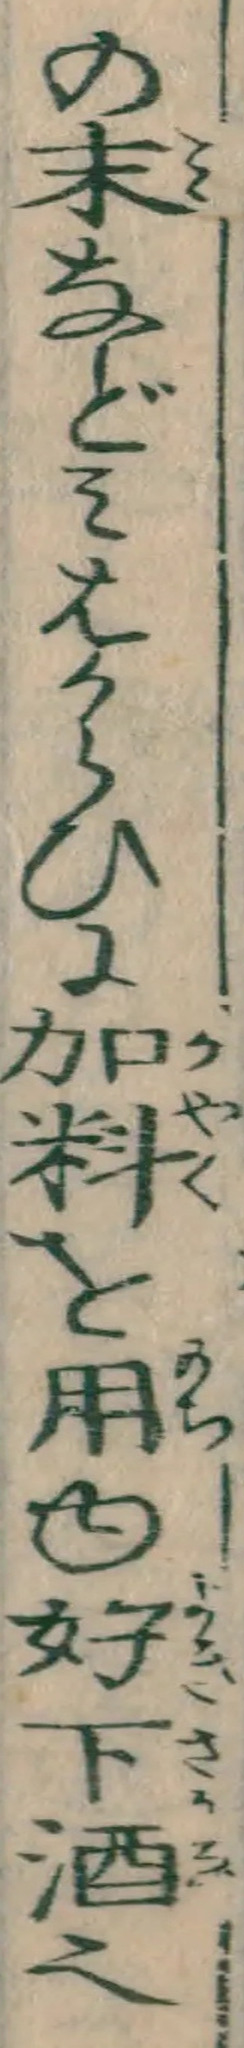の末などみはからひに加料を用ゆ好下酒也
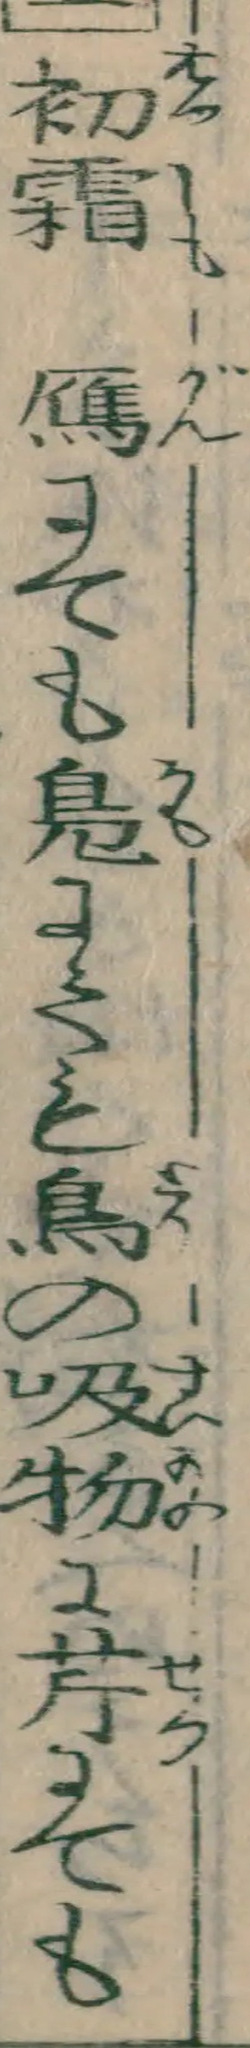卅五初霜鴈にても鳬にても鳥の吸物に芹にても
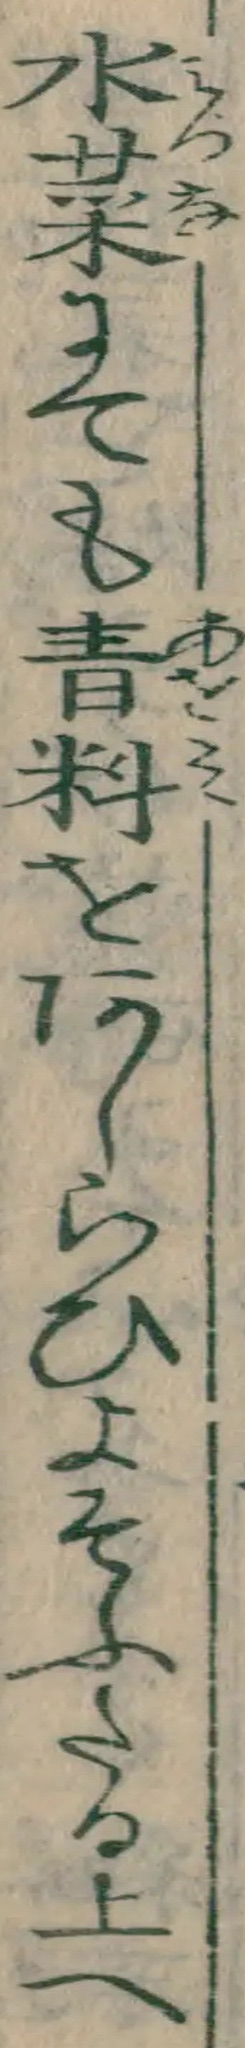水菜にても青料をあしらひよそふたる上へ

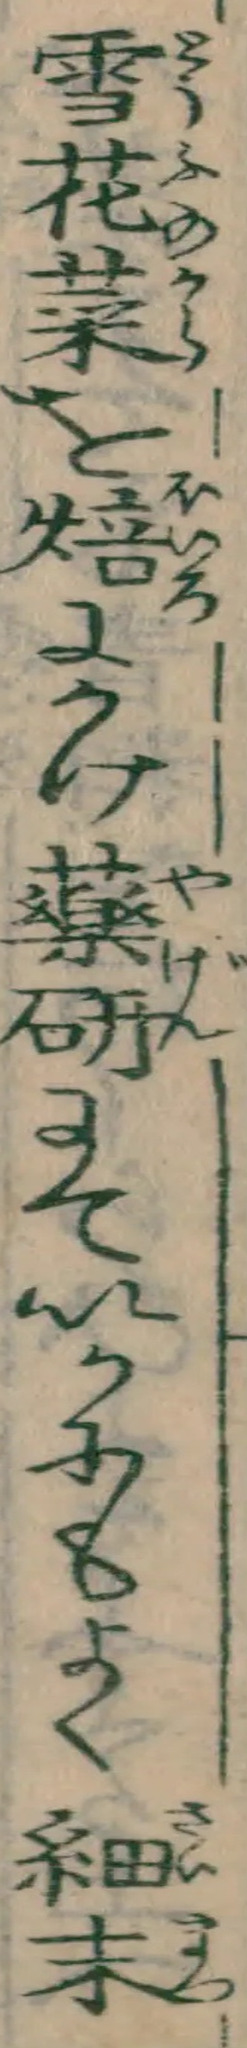雪花菜を焙にかけ薬研にていかにもよく細末
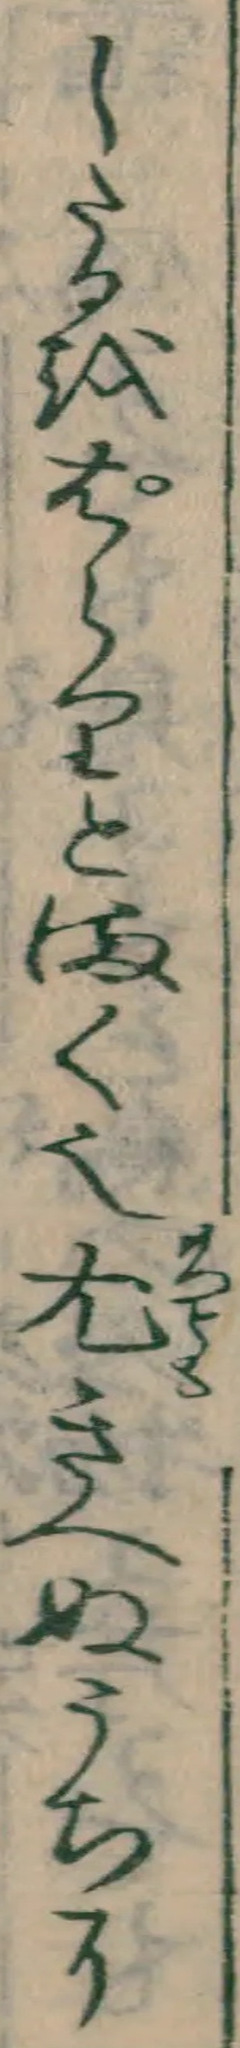したるをぱらりとまく也尤きへぬうちに
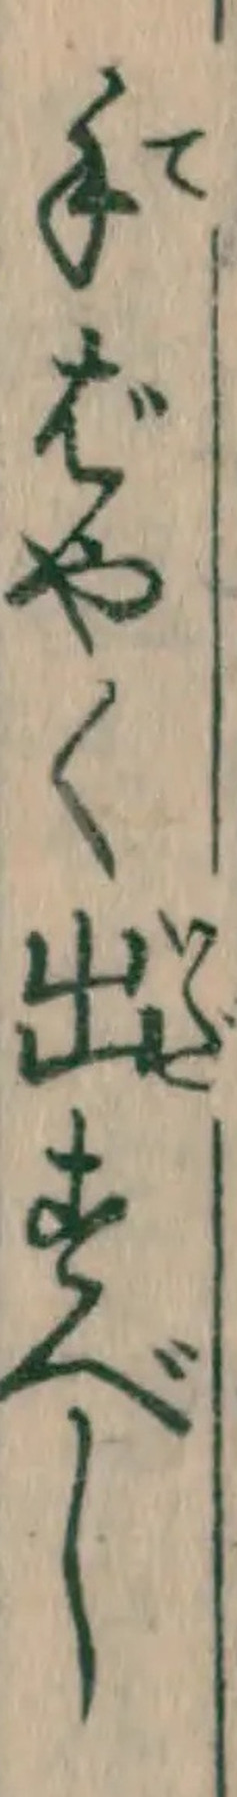手ばやく出すべし
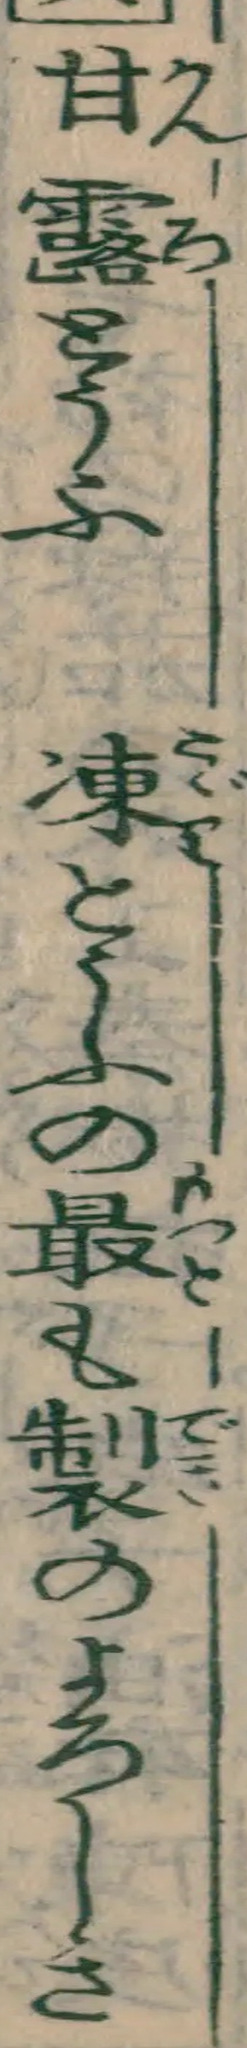卅六甘露とうふ凍とうふの最も製のよろしき
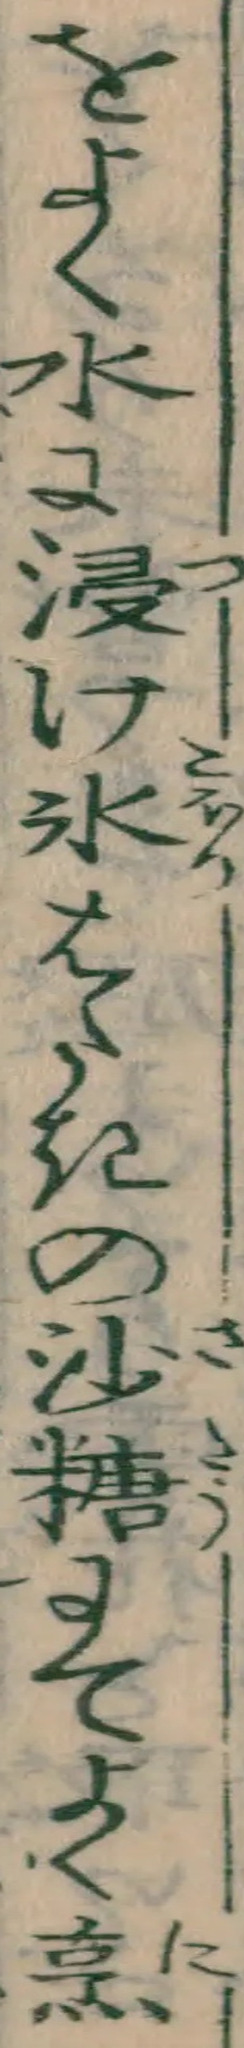をよく水に浸け氷はたきの沙糖にてよく烹
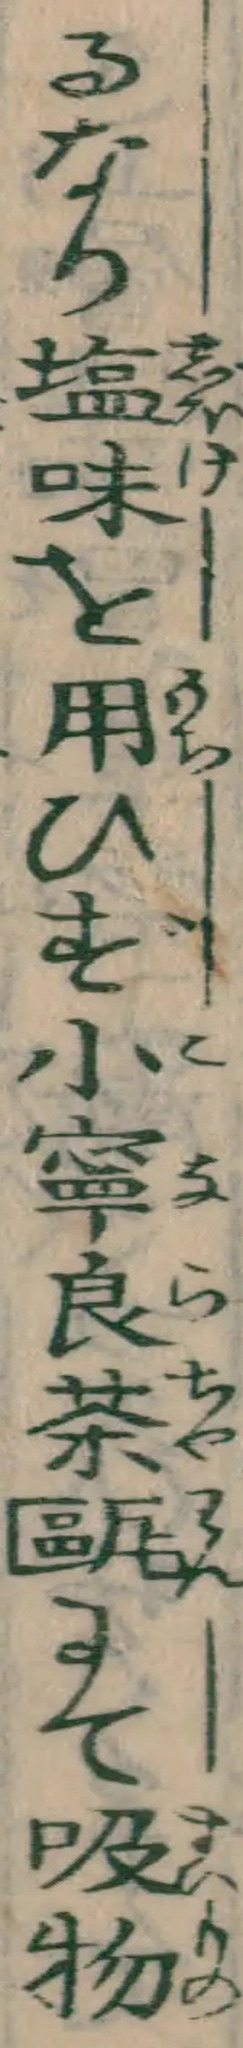るなり塩味を用ひず小寧良茶甌にて吸物
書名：豆腐百珍. 続編
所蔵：国立国会図書館 National Diet Library, JAPAN
